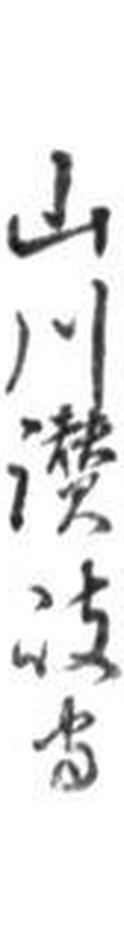山川讃岐守
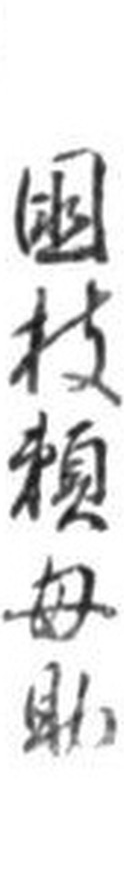国枝頼母助
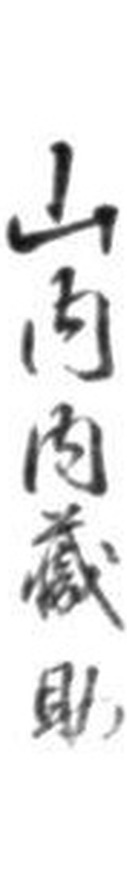山内内蔵助
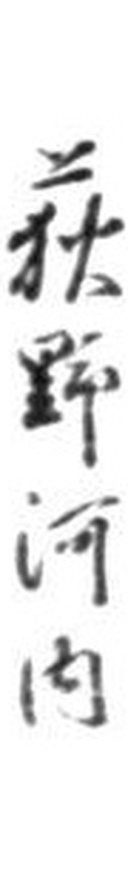荻野河内
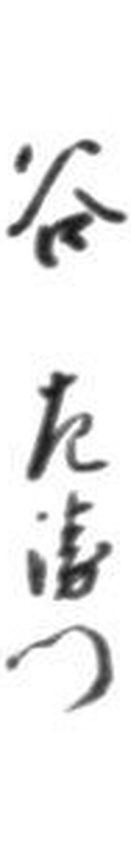谷左衛門
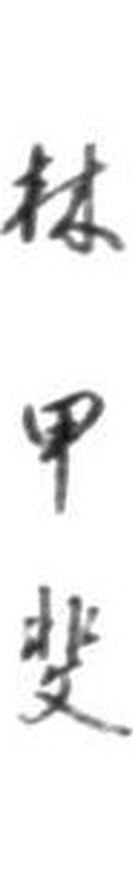林甲斐
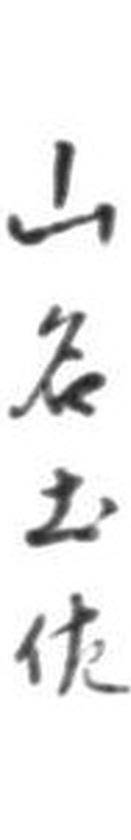山名土佐
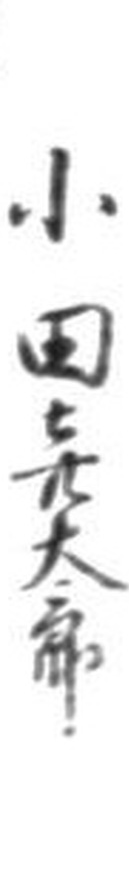小田喜太郎
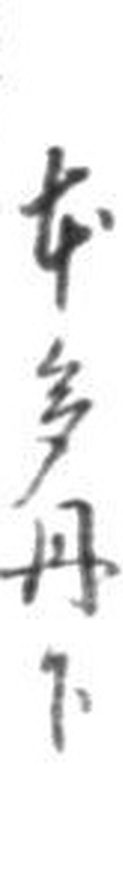本多丹下
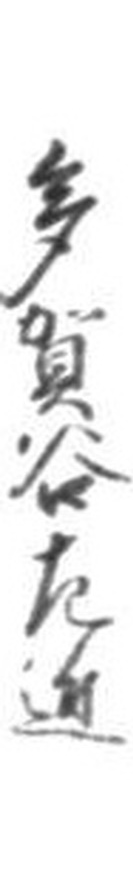多賀谷左近
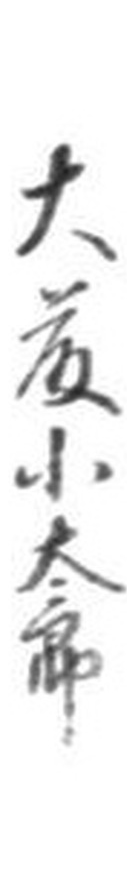大藤小太郎

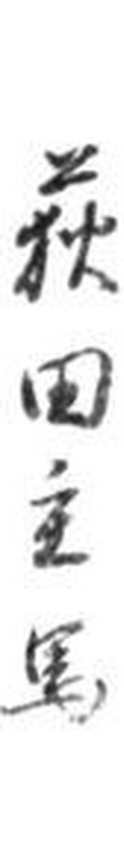荻田主馬
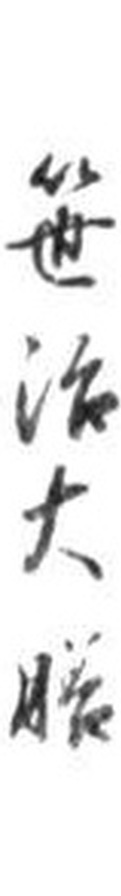笹治大膳
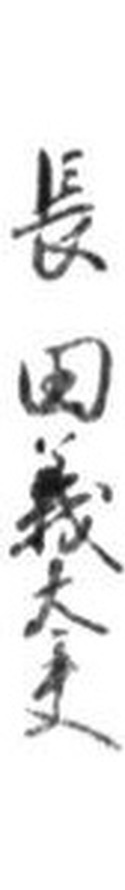長田義太夫
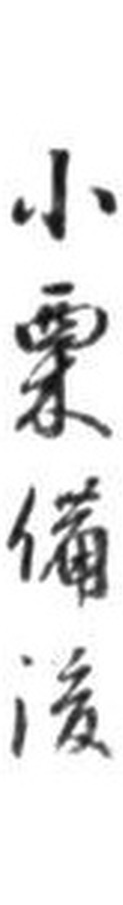小栗備後
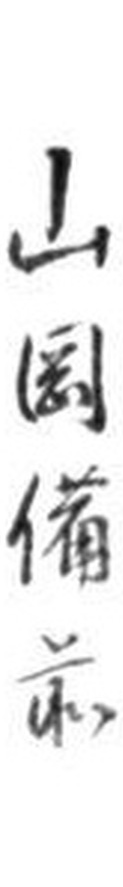山岡備前
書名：家譜 二 忠直公 従文禄四年到慶安四年
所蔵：福井県文書館 Fukui Prefectural Archives
